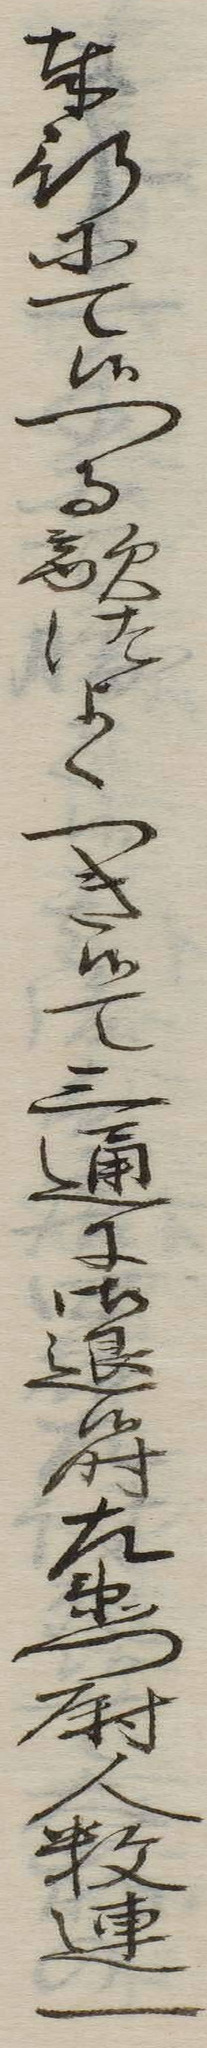奉行にて候つる敵つよくつき候て三通に御退候時左衛門尉人数連一
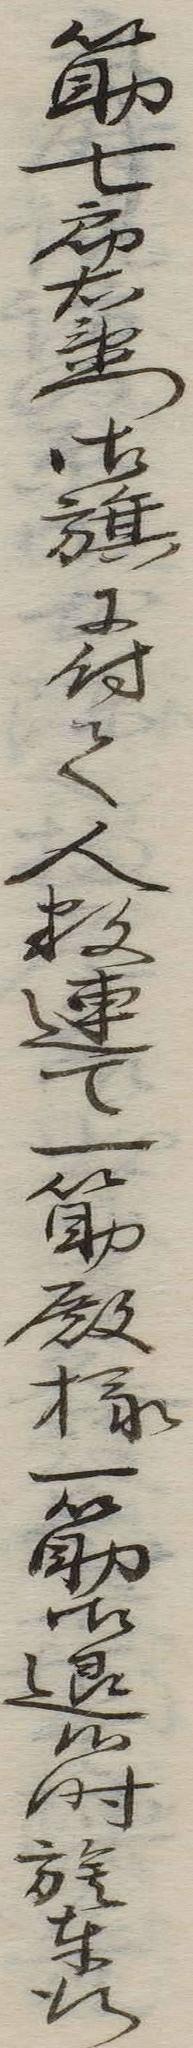筋七郎右衛門御旗に付て人数連て一筋殿様一筋御退候時旗本取
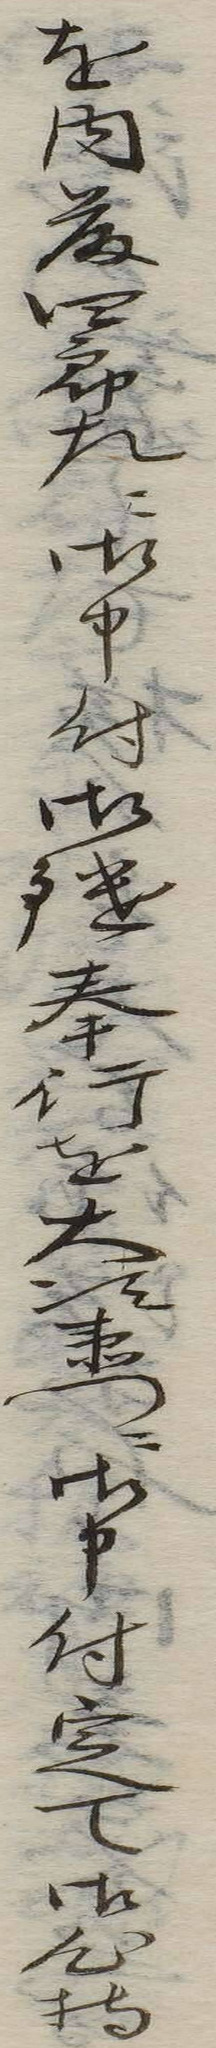を内藤四郎左ニ御申付御鑓奉行を大次衛門ニ御申付定て御心持
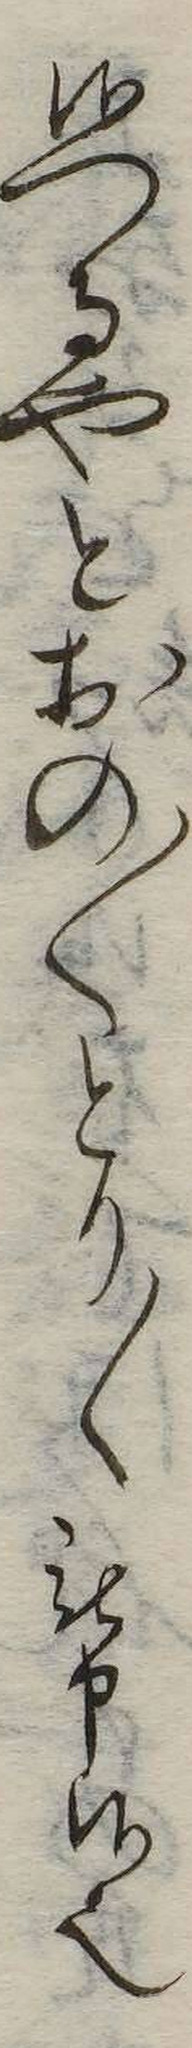候つるやとおの〳〵とり〳〵被申候也
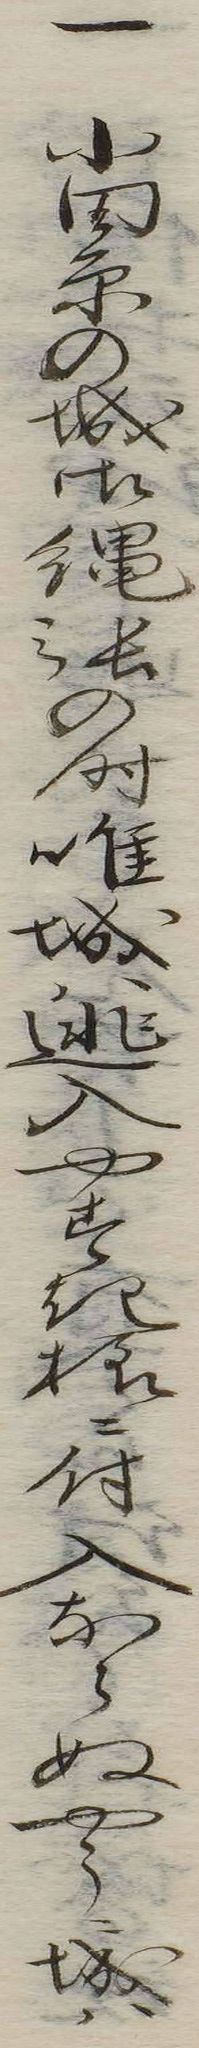一小田原の城御縄強の時唯城は逃入やすき様に付入ならぬやうに城は
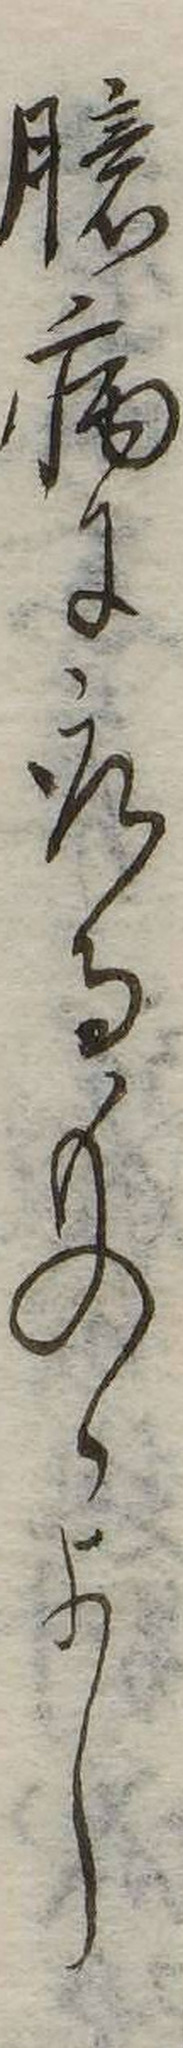臆病に取るものかよし
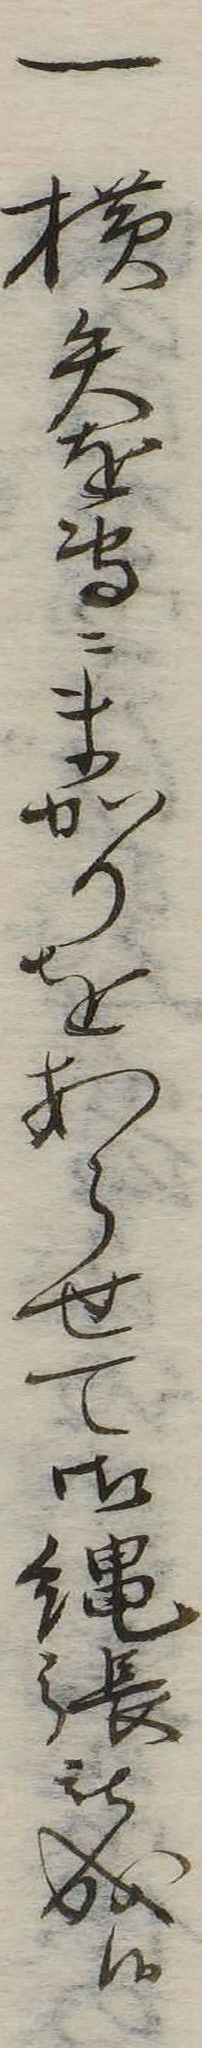一横矢を専ニまかりをあらせて御縄張被成候
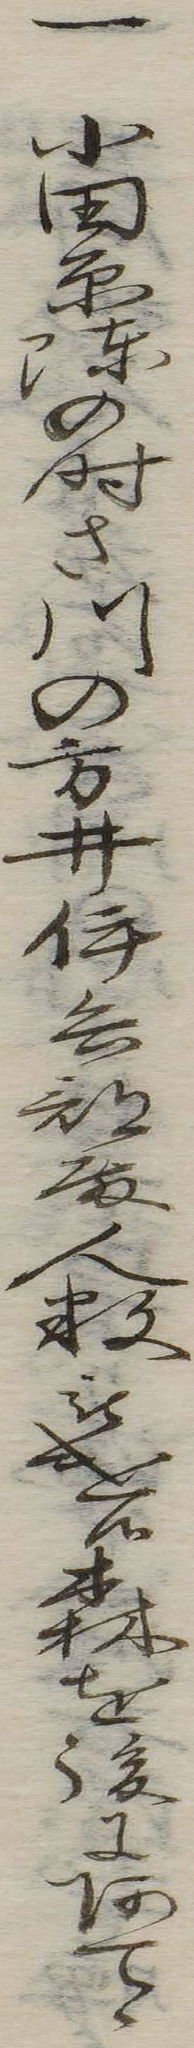一小田原陣の時さ川の方井伊兵部殿人数被遣候森を後にあてて
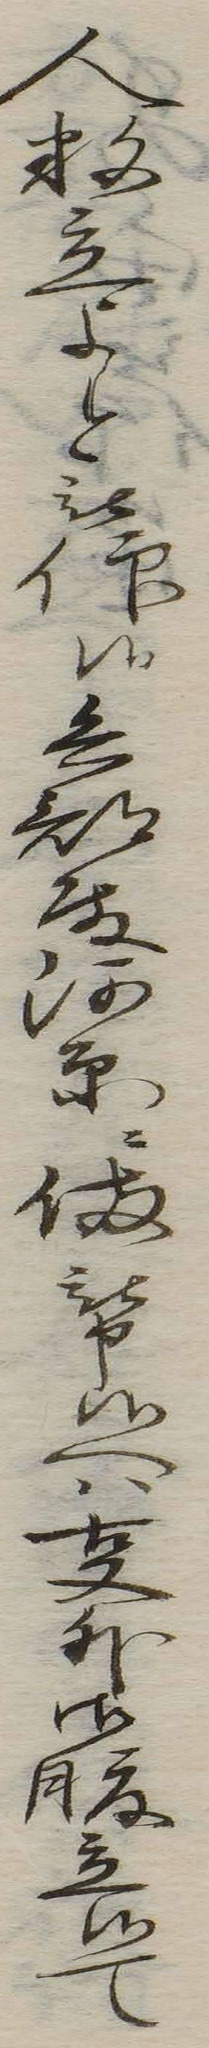人数立よと被仰候兵部殿河原ニ備被申候へは事外御腹立候て
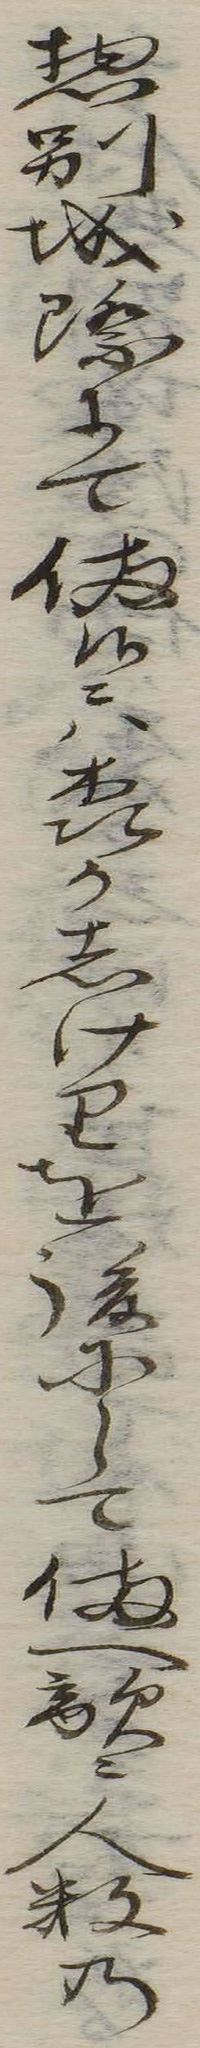惣別城際にて備候ニは森かしけりを後にして備へ敵ニ人数の
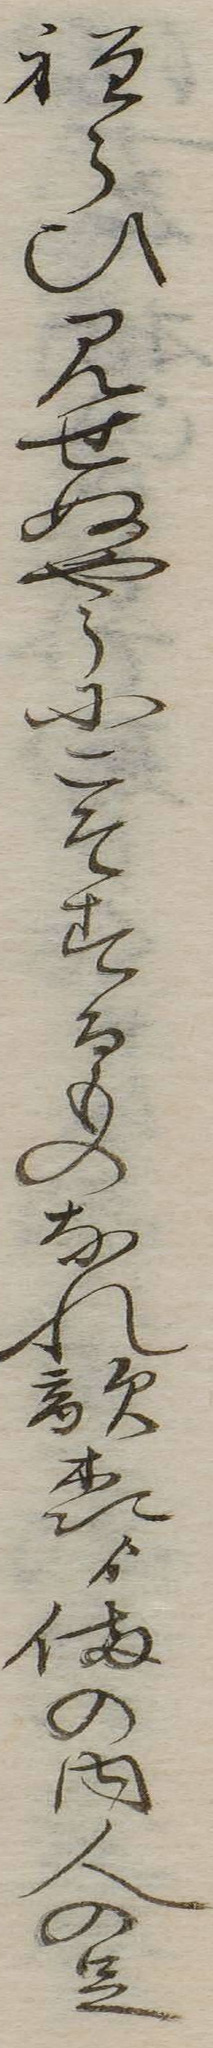程らひ見せぬやうにこそするものなれ敵森ゟ備の内人の足
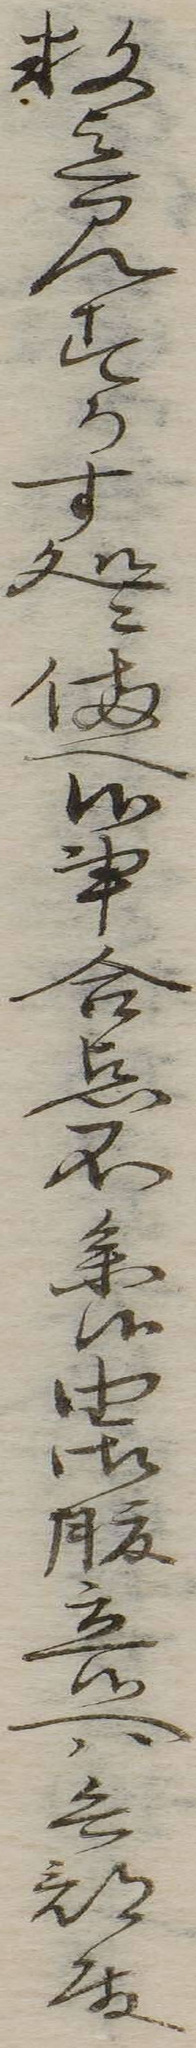数迄見すかす処ニ備へ候事合点不参候由御腹立候へは兵部殿
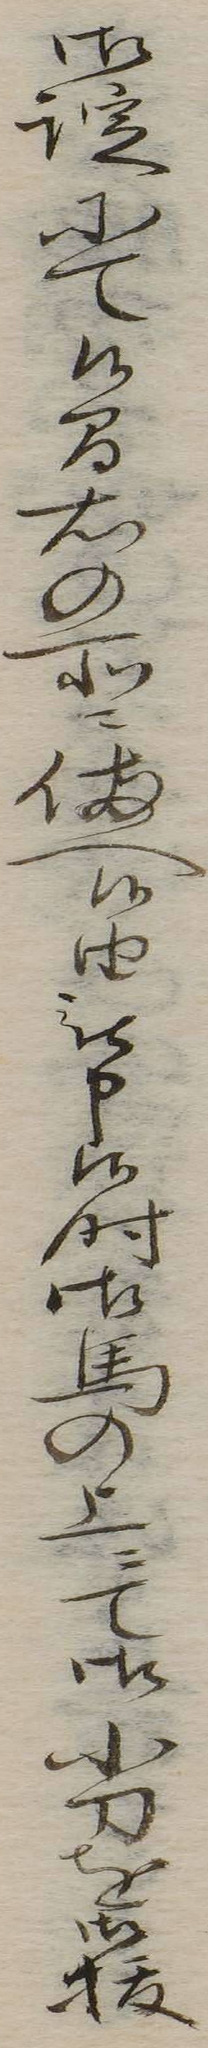御諚にて候間右の所ニ備へ候由被申候時御馬の上ニて御小刀を御抜

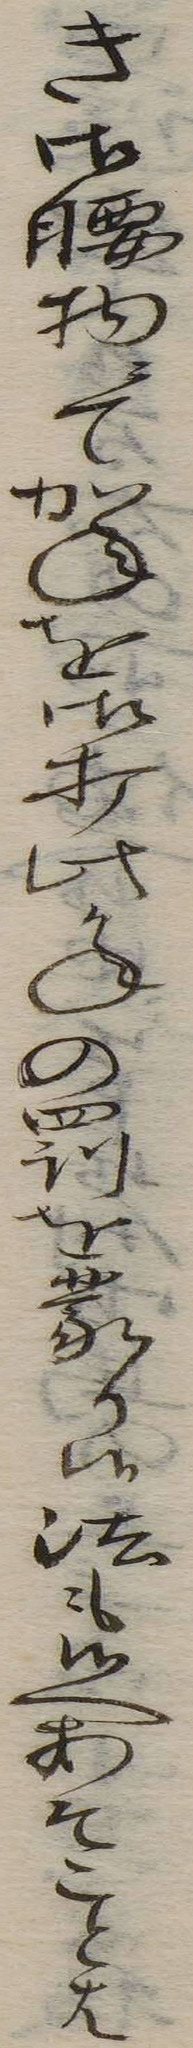き御腰物ニてかねを御打此かねの罰を蒙り候法も候へあそことは
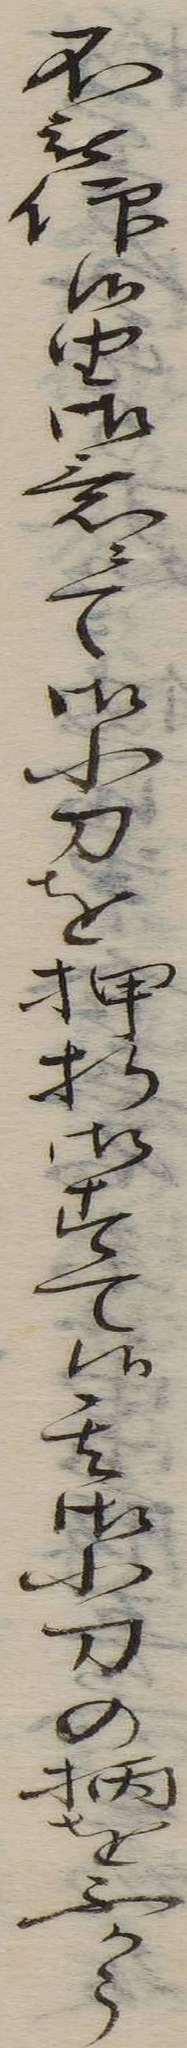不被仰候由御意ニて候ふ小刀を押折御すて候其御小刀の柄をふかう
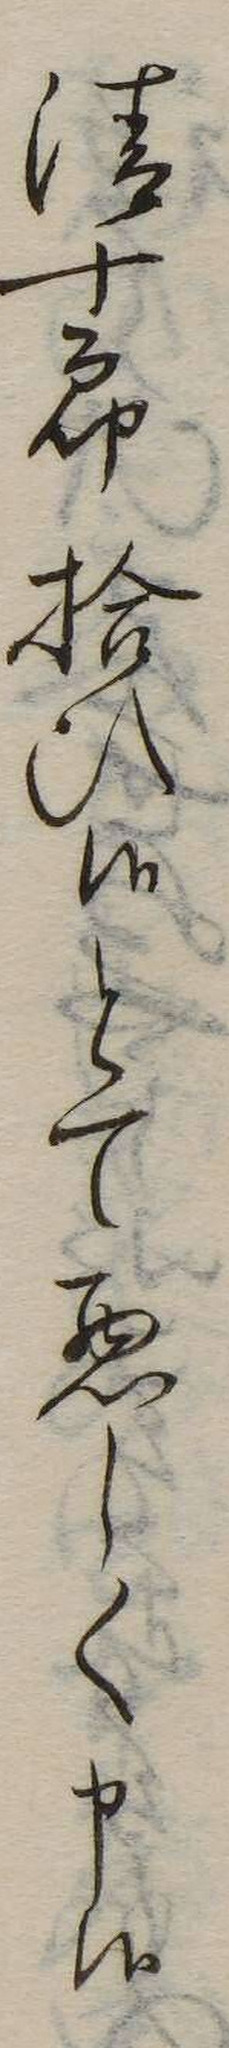清十郎拾ひ候とて悪しく申候
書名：三河之物語
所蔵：国文学研究資料館
